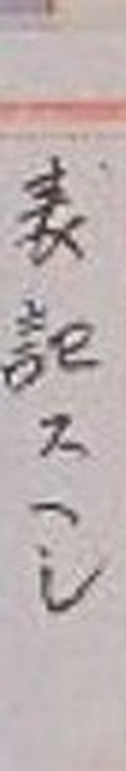表記スヘシ

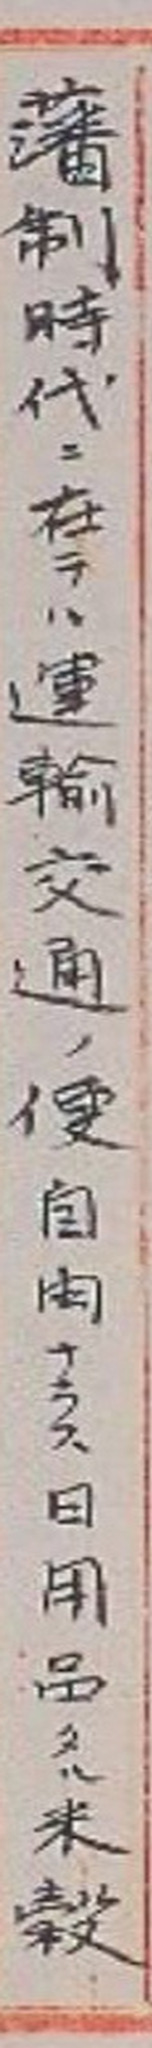藩制時代ニ在テハ運輸交通ノ便自由ナラス日用品タル米穀

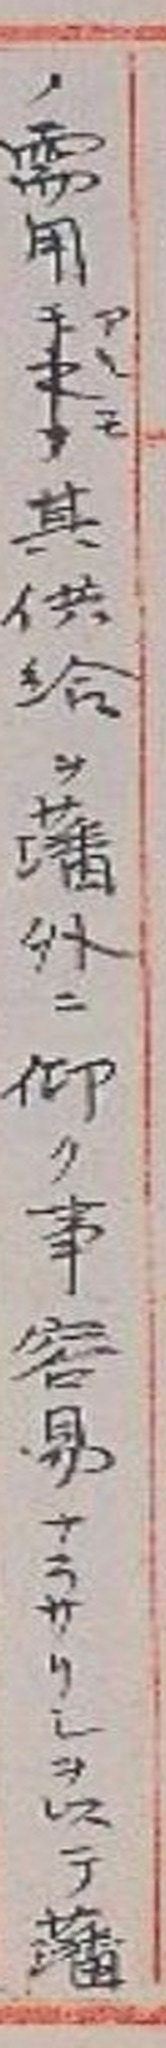ノ需用アルモ其供給ヲ藩外ニ仰ク事容易ナラサリシヲ以テ藩
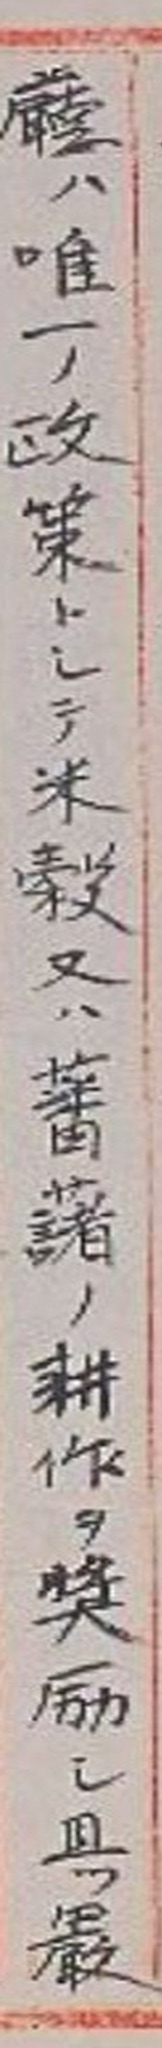庁ハ唯一ノ政策トシテ米穀又ハ蕃藷ノ耕作ヲ奨励シ且ツ厳
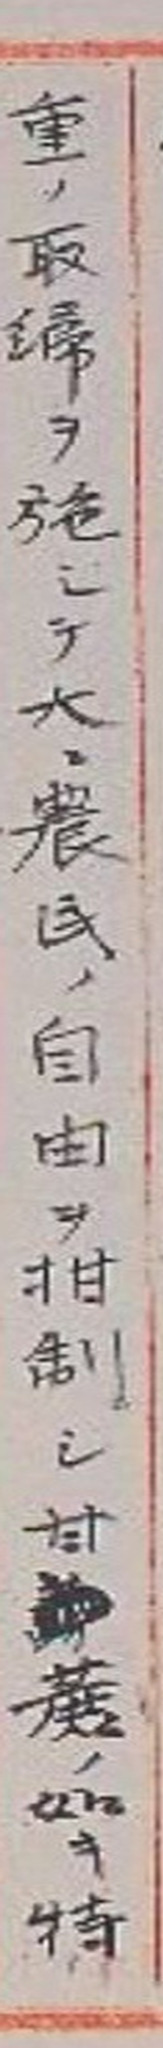重ノ取締ヲ施シテ大ニ農民ノ自由ヲ拑制シ甘蔗ノ如キ特
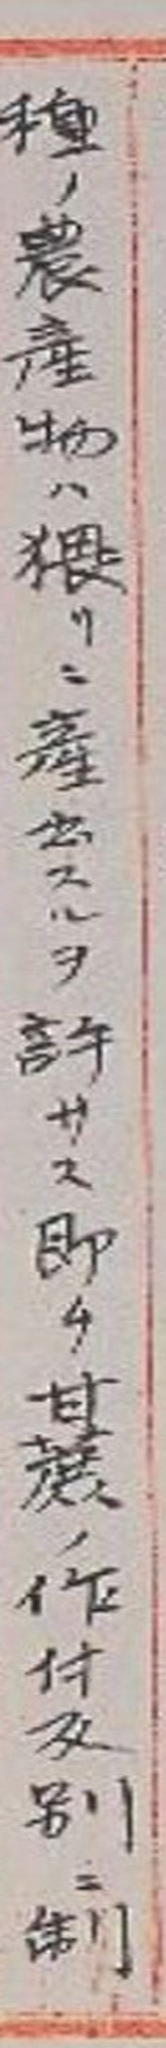種ノ農産物ハ猥リニ産出スルヲ許サス即チ甘蔗ノ作付反別ニ制
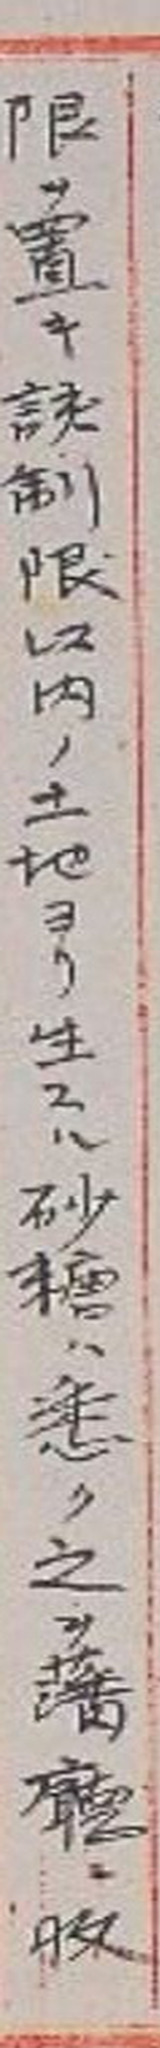限ヲ置キ該制限以内ノ土地ヨリ生スル砂糖ハ悉ク之ヲ藩庁ニ収
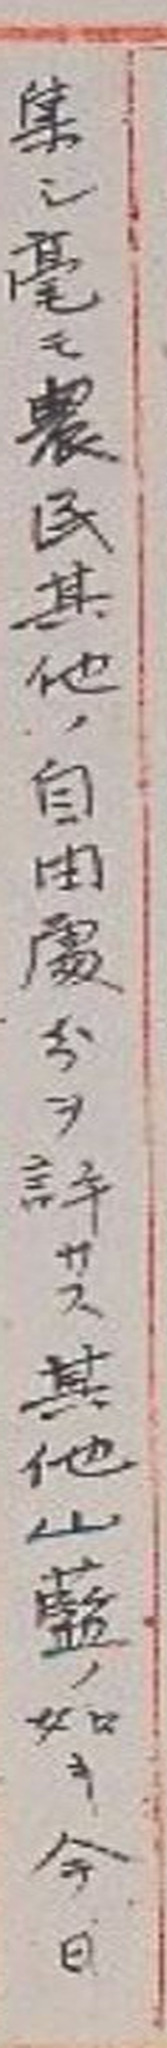集シ毫モ農民其他ノ自由処分ヲ許サス其他山藍ノ如キ今日
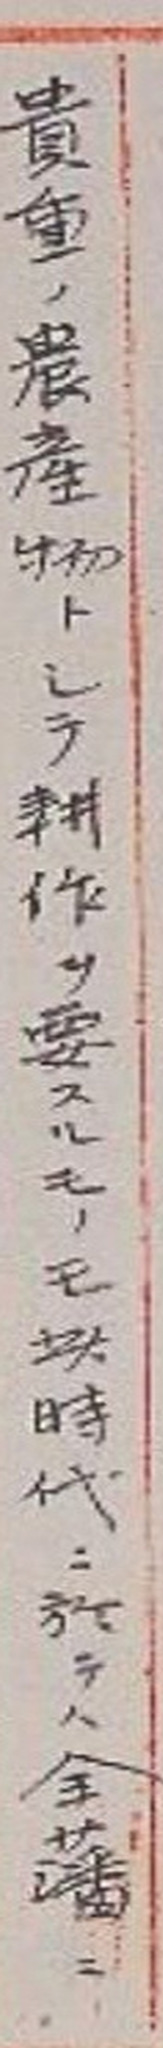貴重ノ農産物トシテ耕作ヲ要スルモノモ此時代ニ於テハ全藩ニ
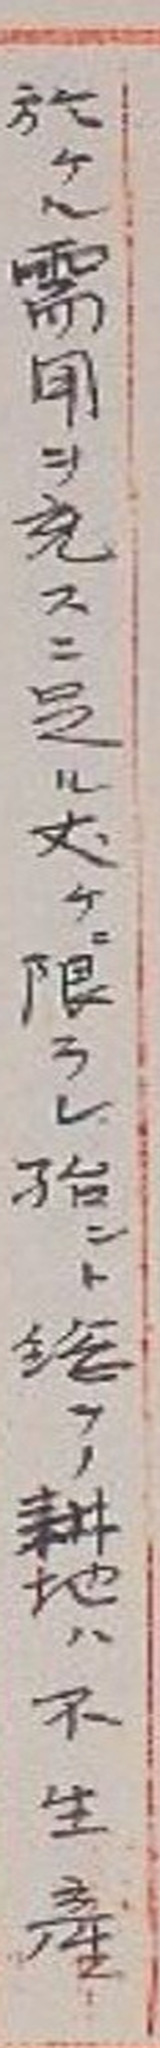於ケル需用ヲ充スニ足ル丈ケニ限ラレ殆ント総テノ耕地ハ不生産
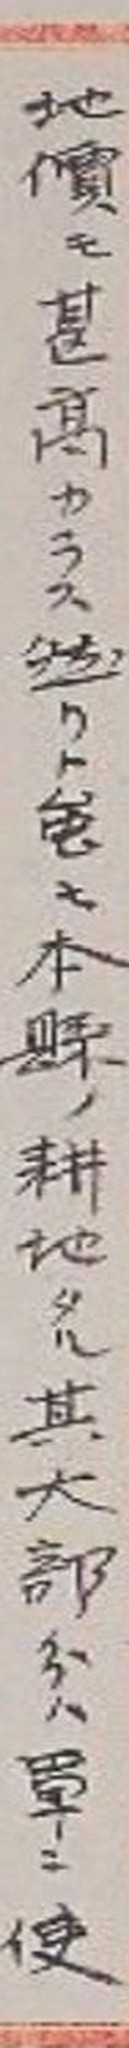地価モ甚高カラス然リト雖モ本県ノ耕地タル其大部分ハ単ニ使
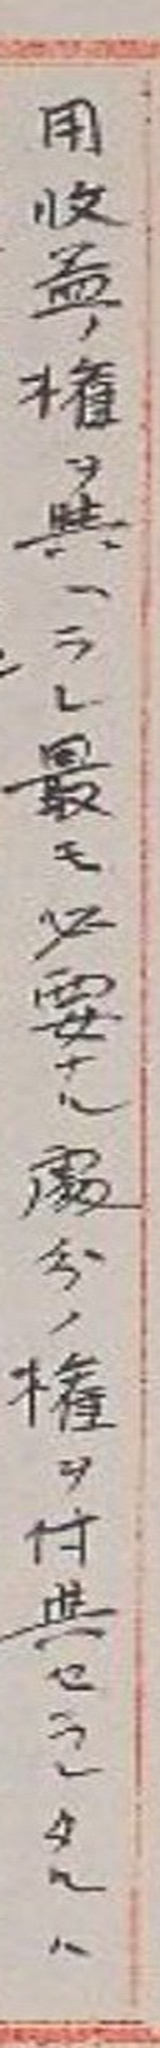用収益ノ権ヲ与ヘラレ最モ必要ナル処分ノ権ヲ付与セラレタルハ
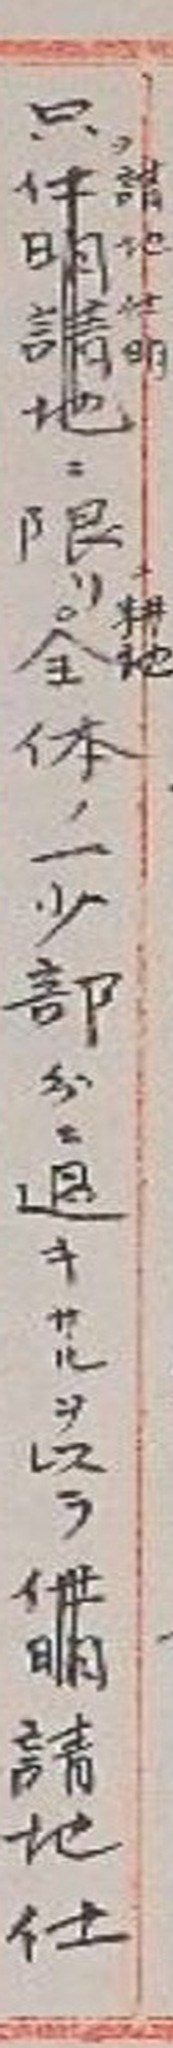只請地仕明ニ限リ耕地全体ノ一少部分ニ過キサルヲ以テ請地仕
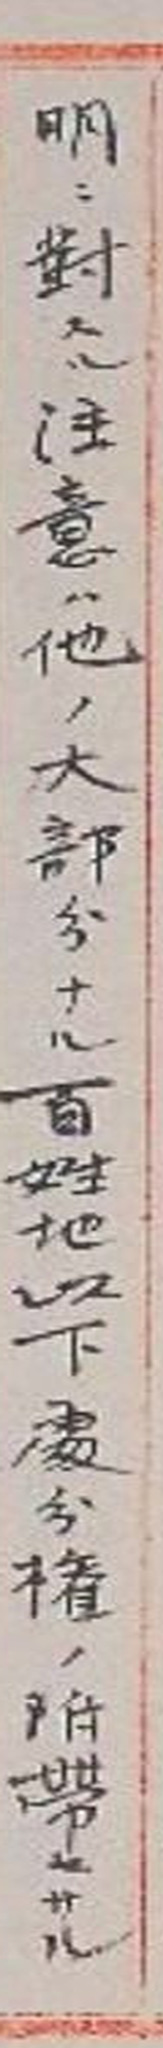明ニ対スル注意ハ他ノ大部分ナル百姓地以下処分権ノ附帯セサル
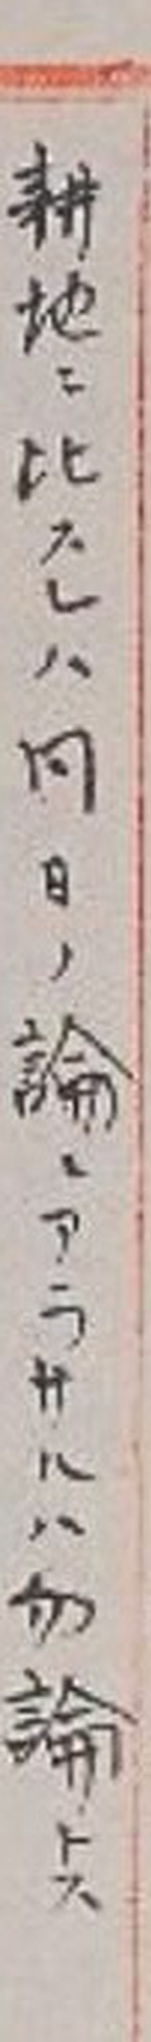耕地ニ比スレハ同日ノ論ニアラサルハ勿論トス
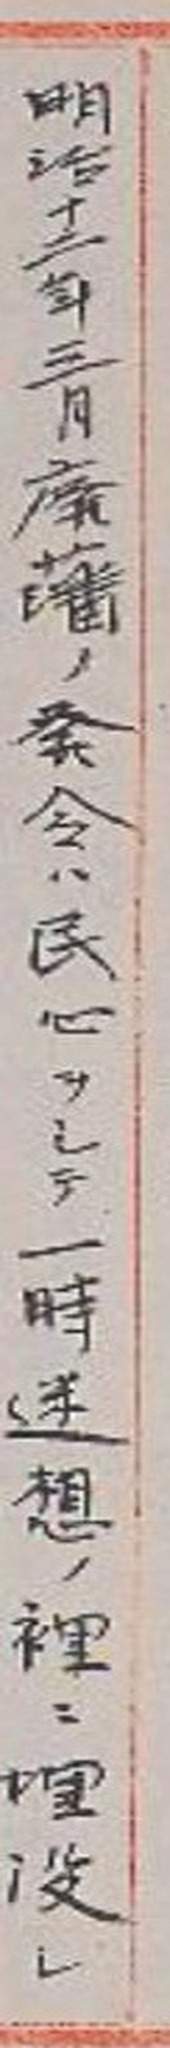明治十二年三月廃藩ノ発令ハ民心ヲシテ一時迷想ノ裡ニ埋没シ
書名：本県地価ノ高キ理由調書
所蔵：University of the Ryukyus Library
